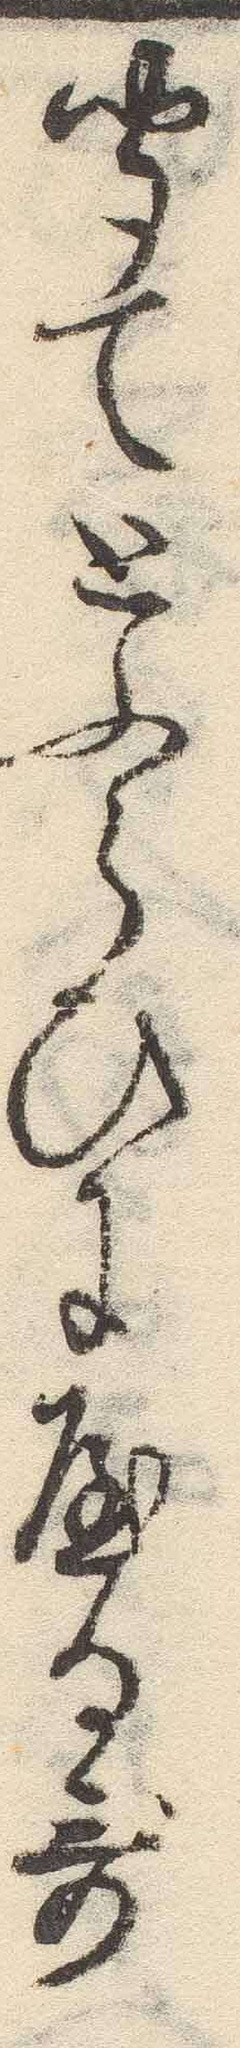聞てとふらひにやる歌
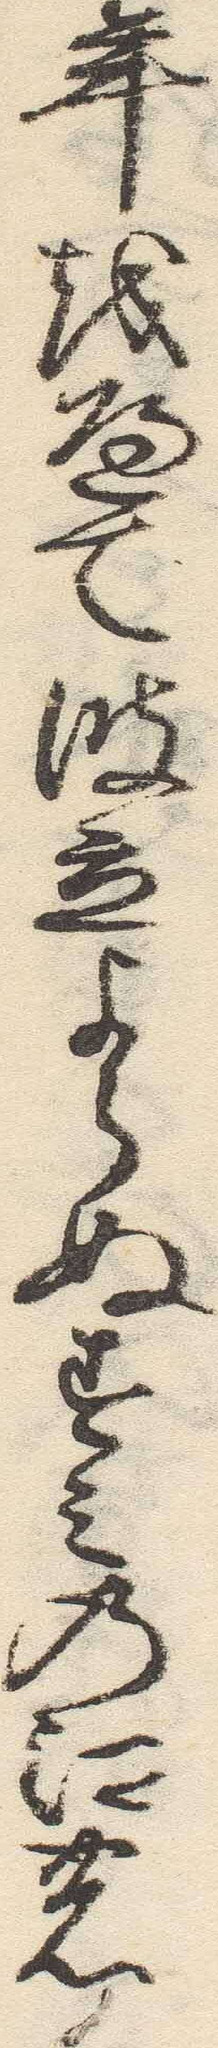年をへて波立よらぬすみの江の
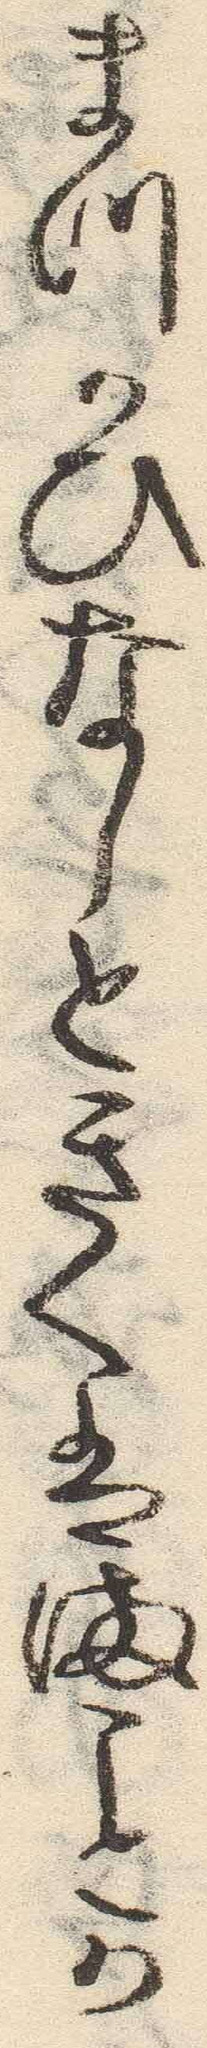まつかひなしときくはまことか
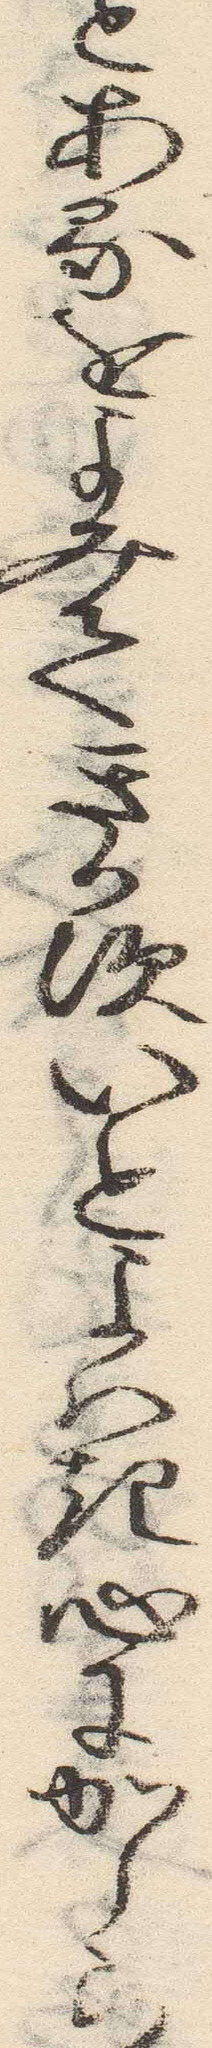とあるをよみてきかすいとよはき心にかしら
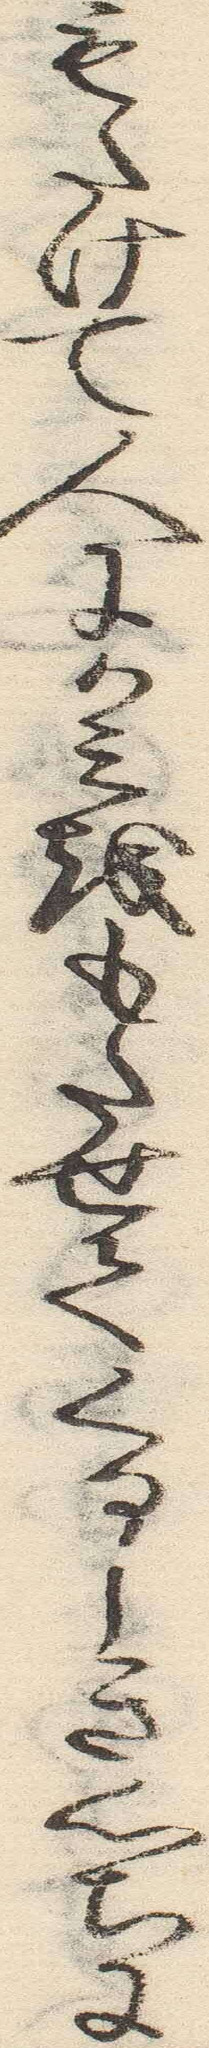もたけて人にかみをもたせてくるしき心ちに
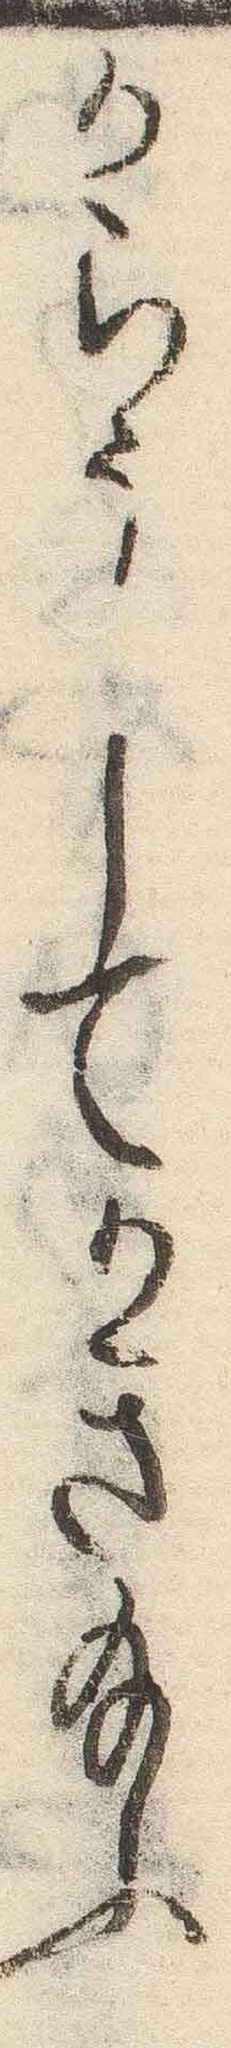からうしてかき給ふ
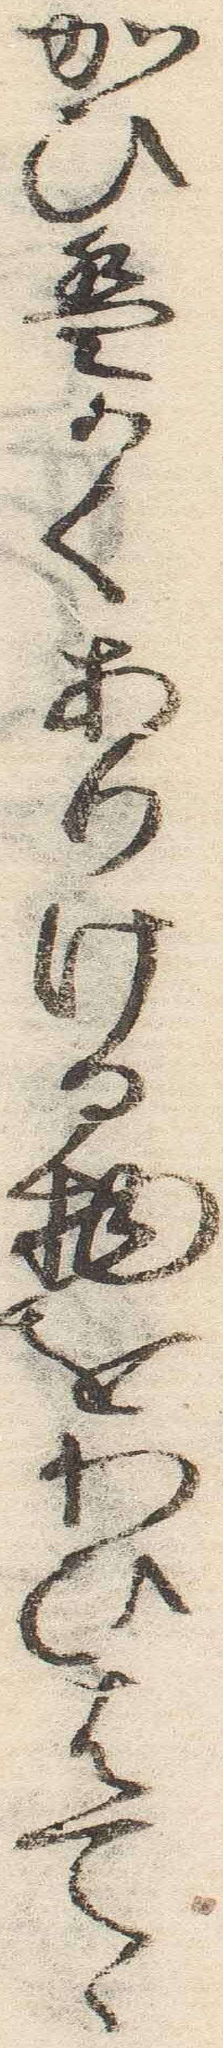かひはかくありける物をわひはてゝ
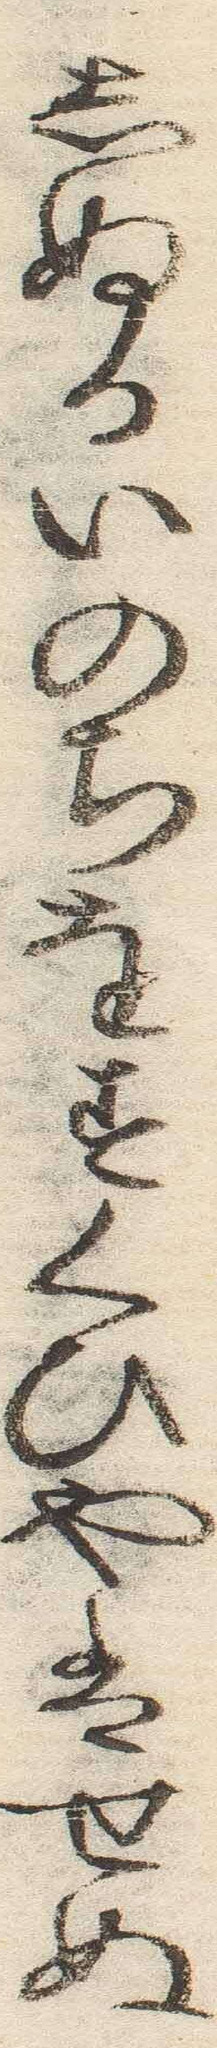しぬるいのちをすくひやはせぬ
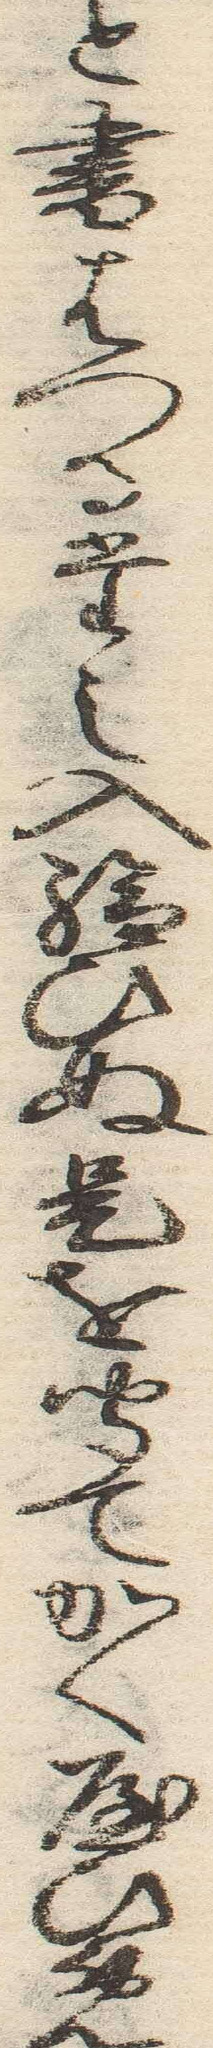と書はつるたえ入給ひぬ是を聞てかくやひめ
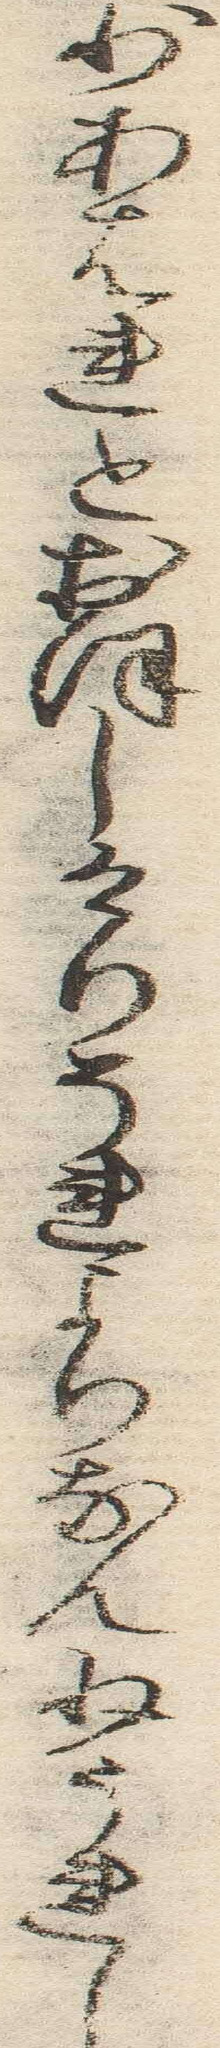少あはれとおほしけりそれよりなん少うれし
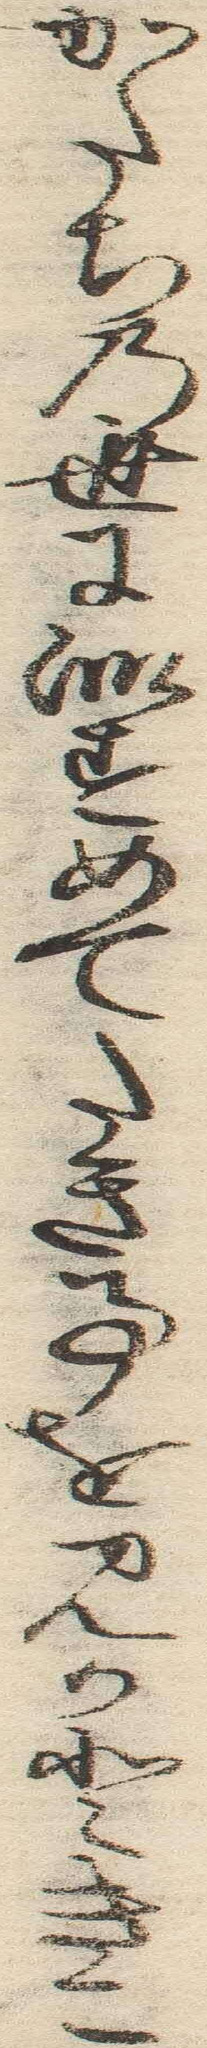かたちの世に似すめてたき事をみかときこ
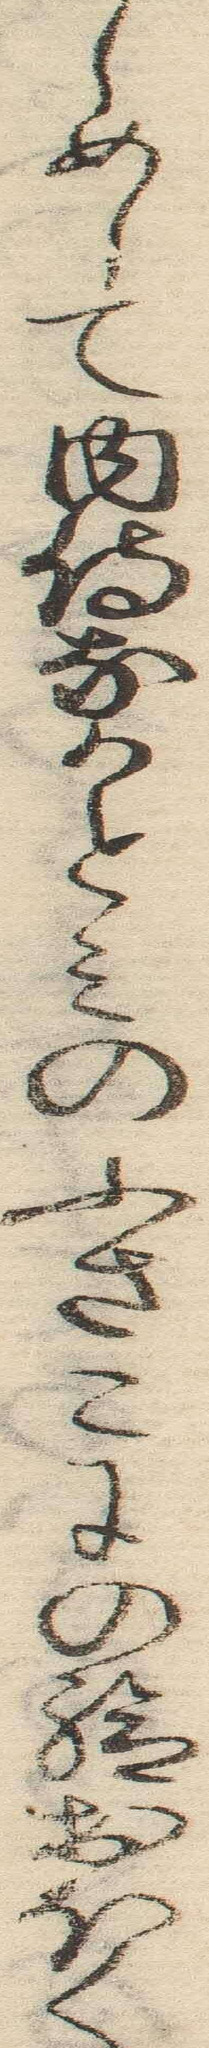しめして内侍なかとみのふさこにの給うおほく

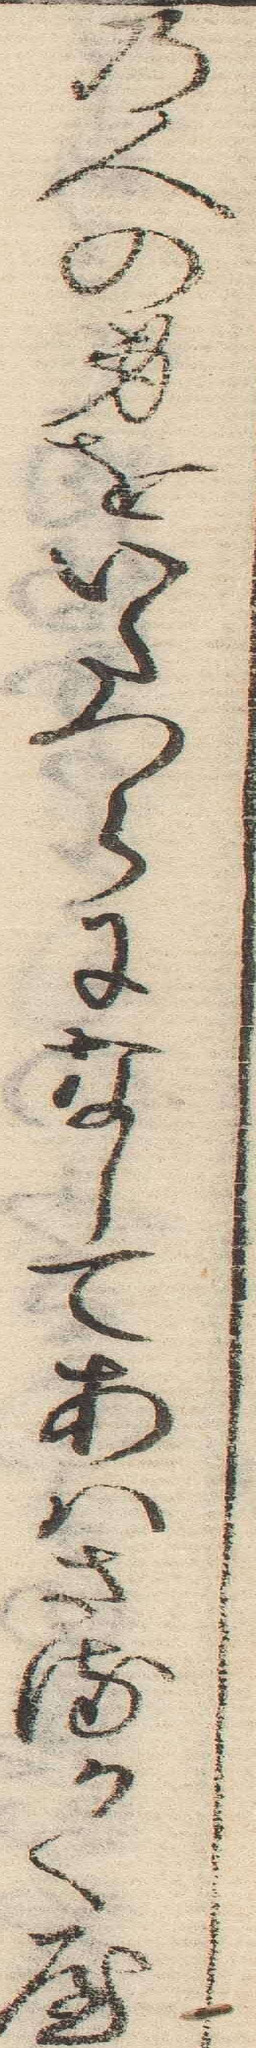の人の身をいたつらになしてあはさるかくや
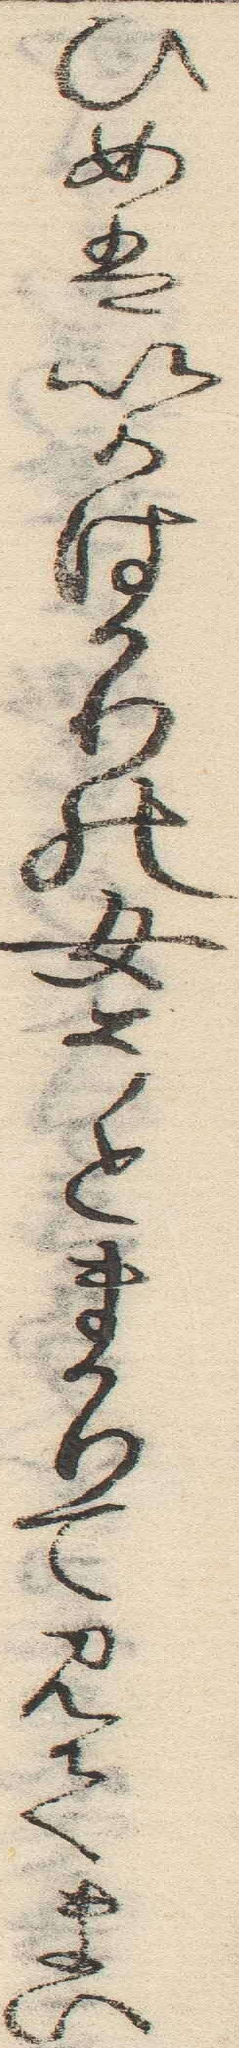ひめはいかはかりの女そとまかりて見てまい
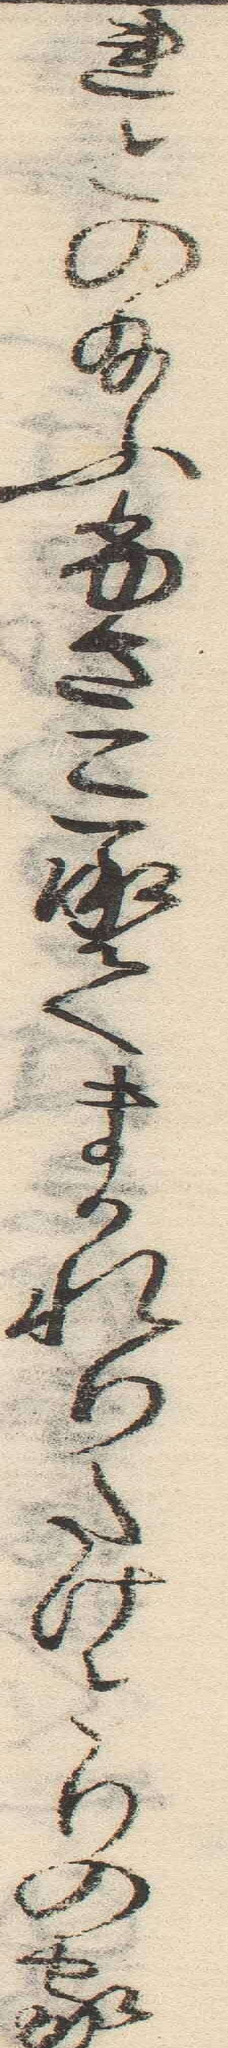れとの給ふふさこ承てまかれりたけとりの家
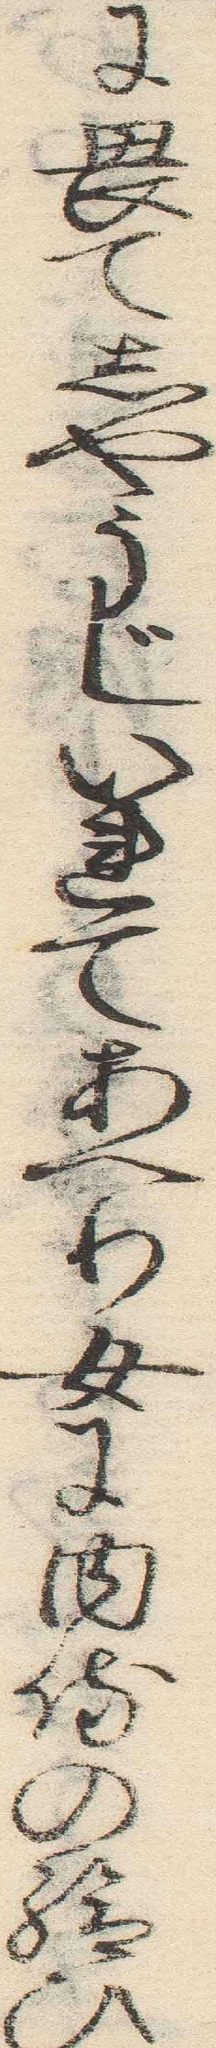に畏てしやうじいれてあへり女に内侍の給ひ
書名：竹取物語
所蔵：東京学芸大学附属図書館 国文学研究資料館
